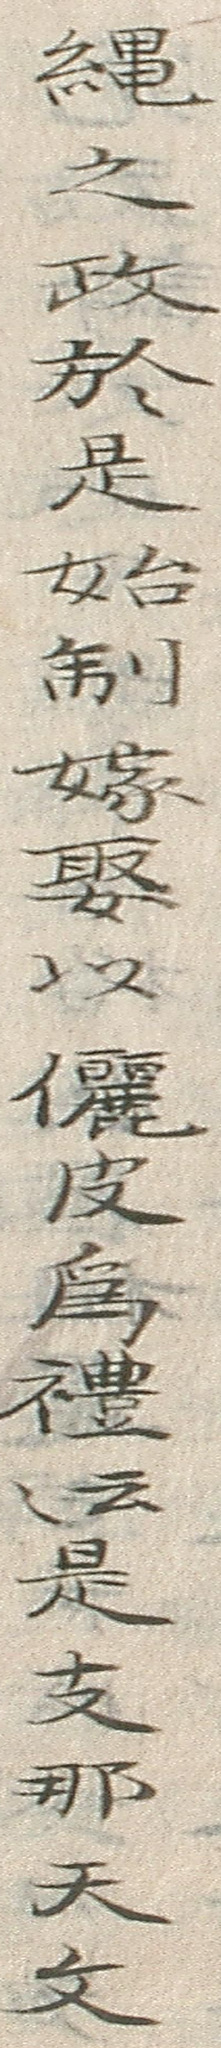縄之政於是始制嫁娶以儷皮為礼云〻是支那天文
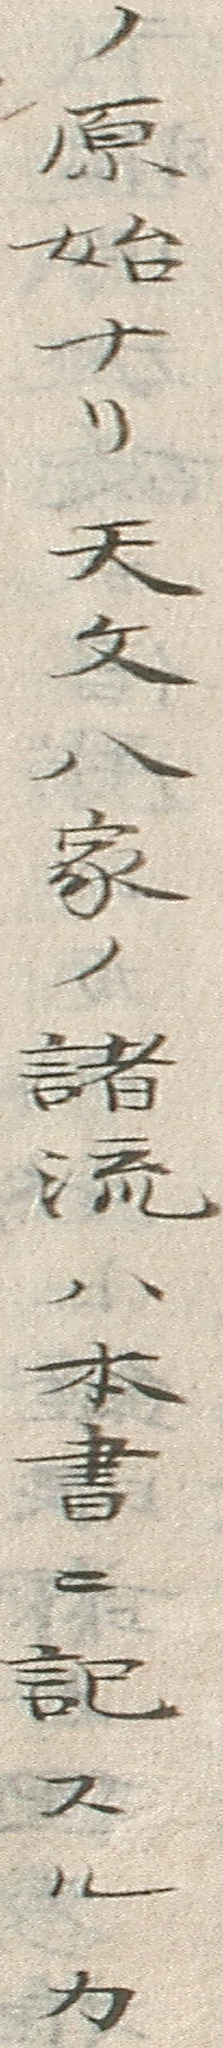ノ原始ナリ天文八家ノ諸流ハ本書ニ記スルカ
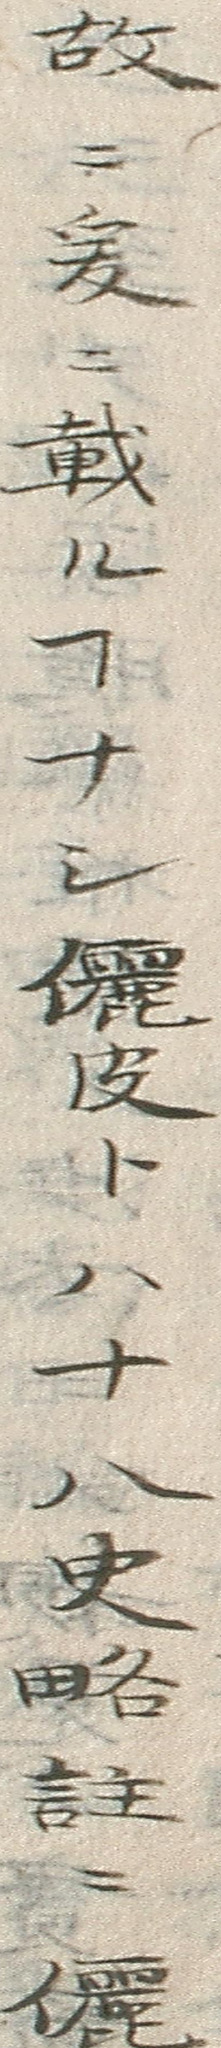故ニ爰ニ載ルコトナシ儷皮トハ十八史略註ニ儷
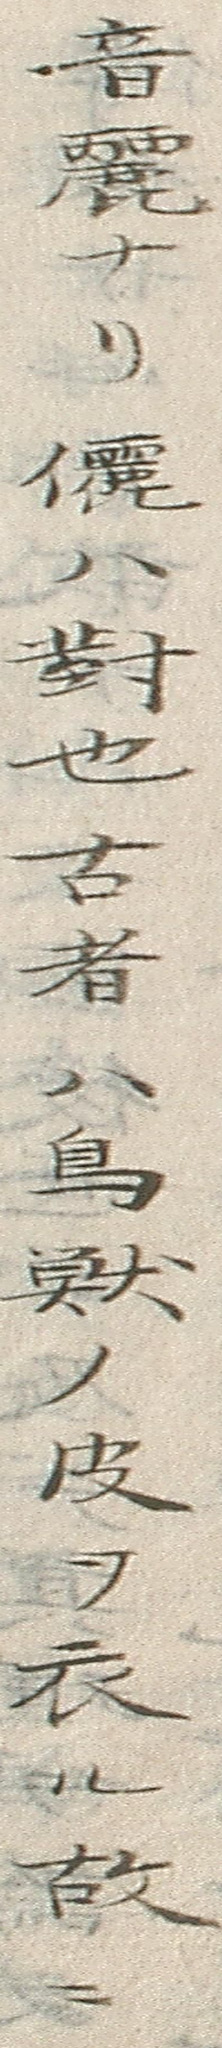音麗ナリ儷ハ対也古者ハ鳥獣ノ皮ヲ衣ル故ニ
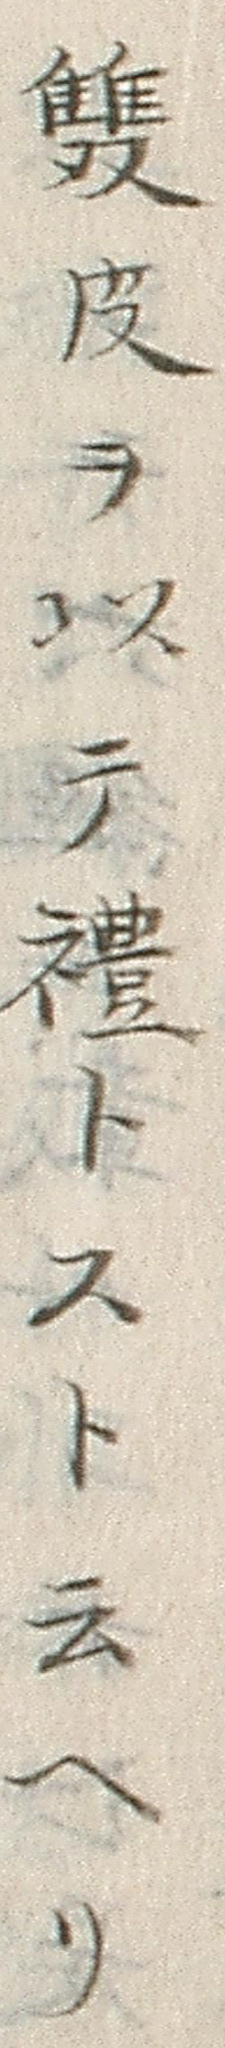雙皮ヲ以テ礼トスト云ヘリ
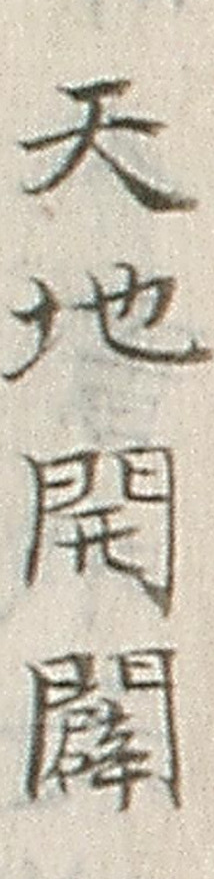天地開闢

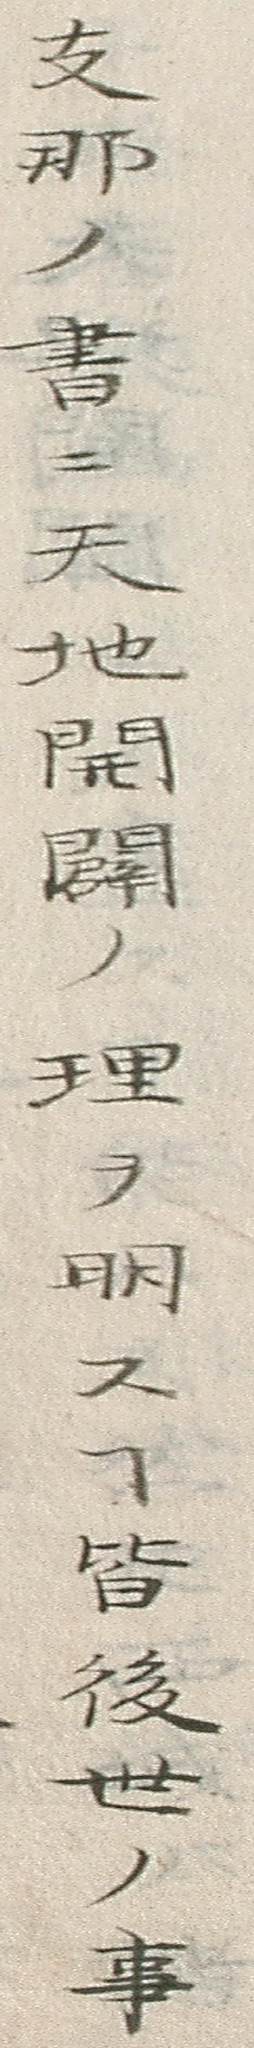支那ノ書ニ天地開闢ノ理ヲ明スコト皆後世ノ事
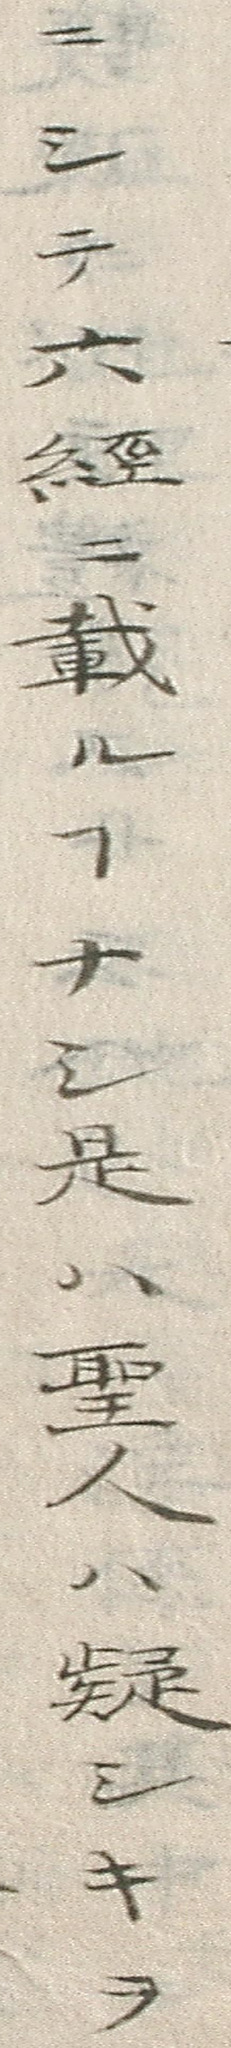ニシテ六経ニ載ルコトナシ是ハ聖人ハ疑シキヲ
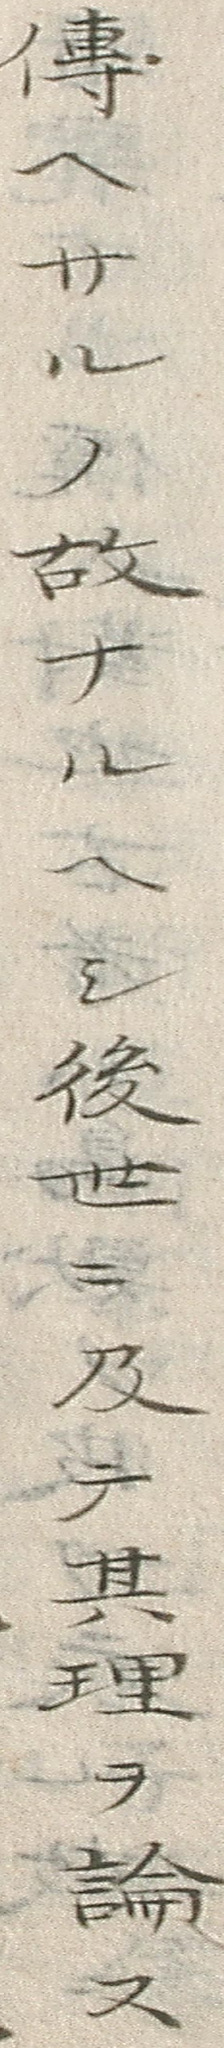伝ヘサルノ故ナルヘシ後世ニ及テ其理ヲ論ス
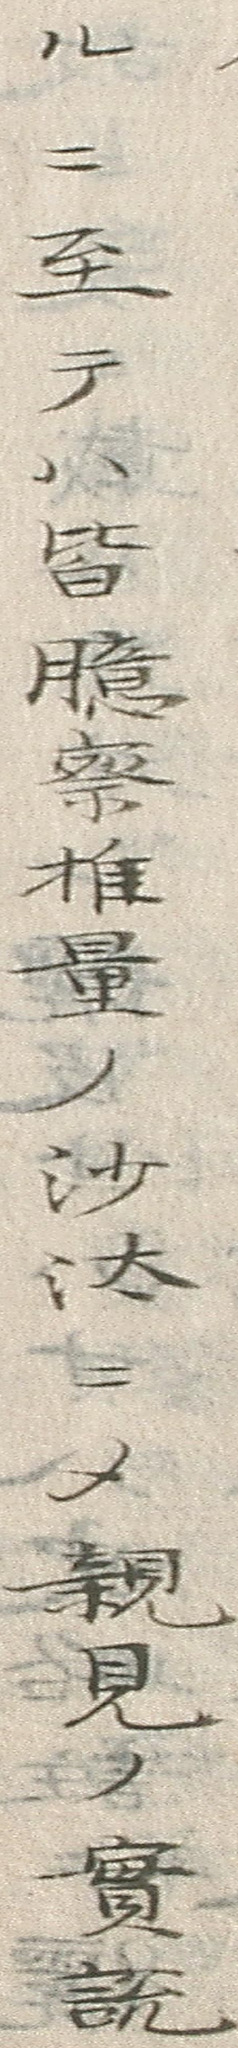ルニ至テハ皆臆察推量ノ沙汰ニシテ親身ノ実説
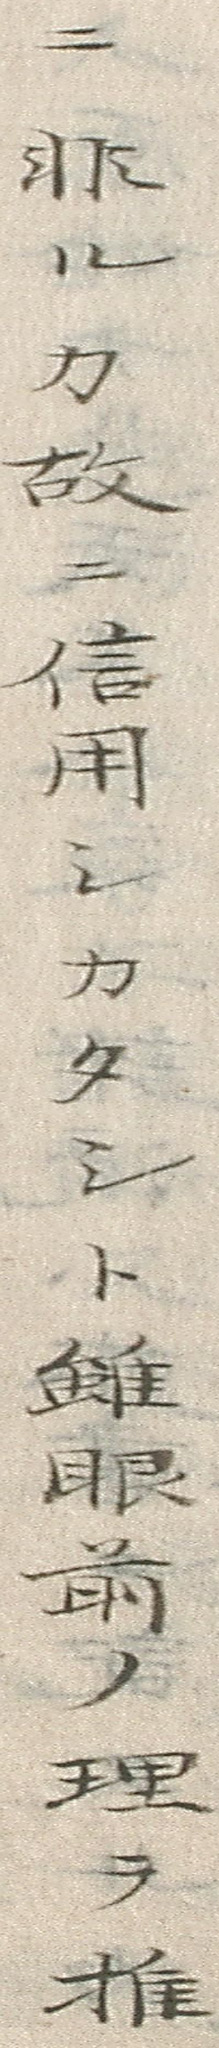ニ非ルカ故ニ信用シカタシト雖眼前ノ理ヲ推
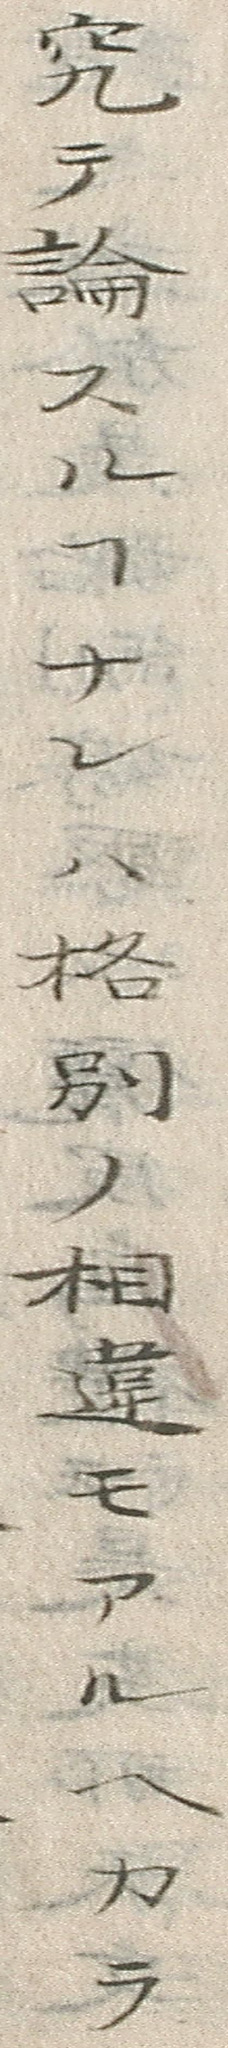究テ論スルコトナレハ格別ノ相違モアルヘカラ
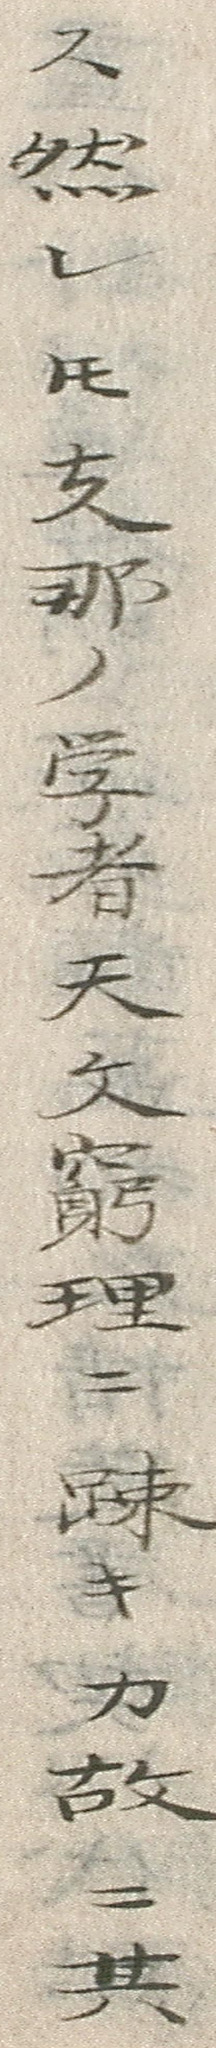ス然レトモ支那ノ学者天文窮理ニ疎キカ故ニ共
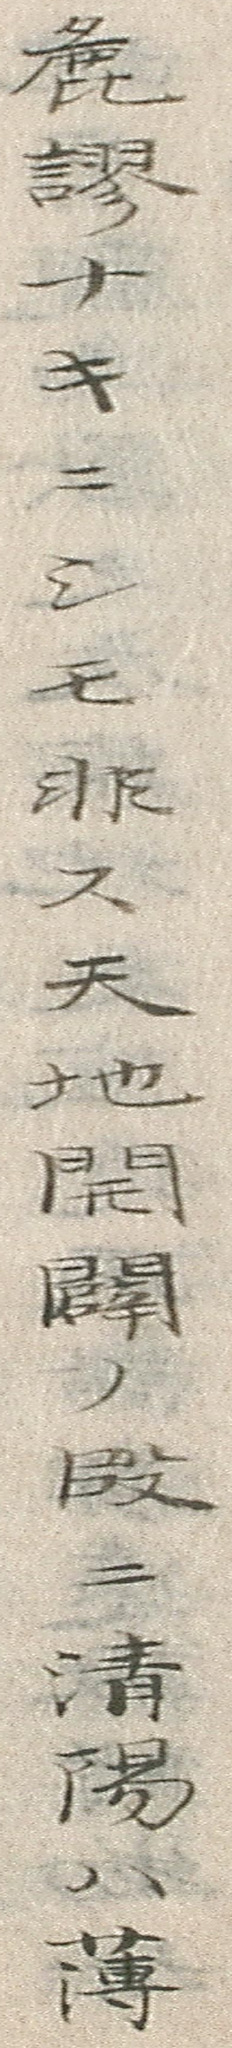麁謬ナキニシモ非ス天地開闢ノ𣪃ニ清陽ハ薄
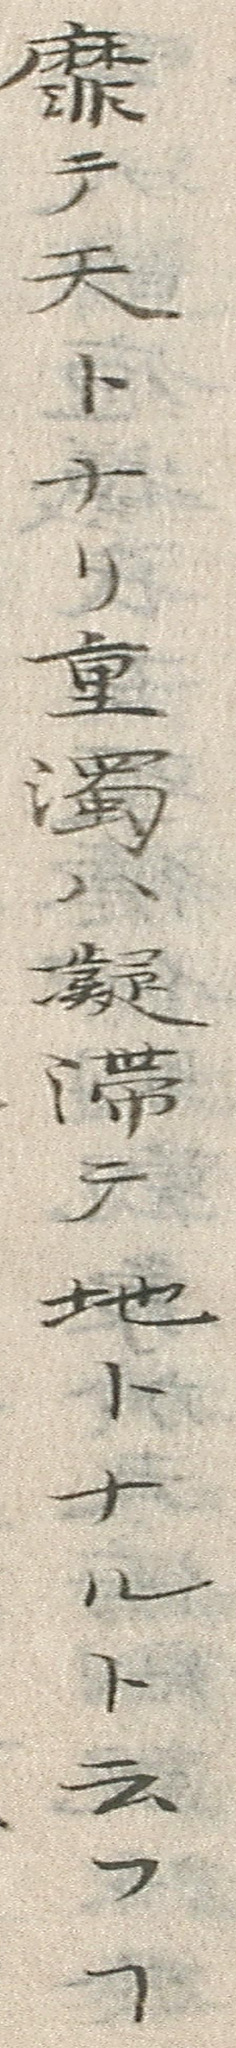靡テ天トナリ重濁ハ凝滞テ地トナルト云フコト
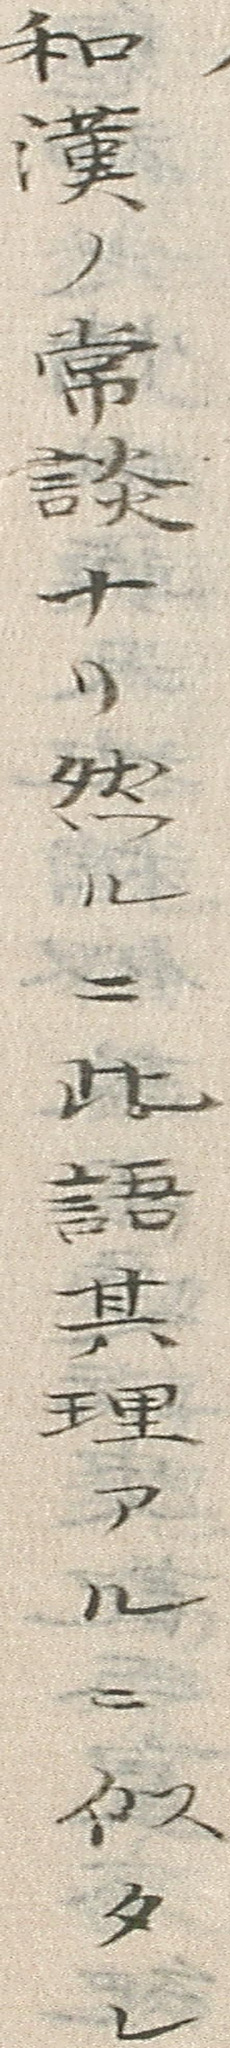和漢ノ常談ナリ然ルニ此語其理アルニ似タレ
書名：天學略名目羽翼　全
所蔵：東京大学地震研究所図書室 Earthquake Research Institute Library, The University of Tokyo, JAPAN
